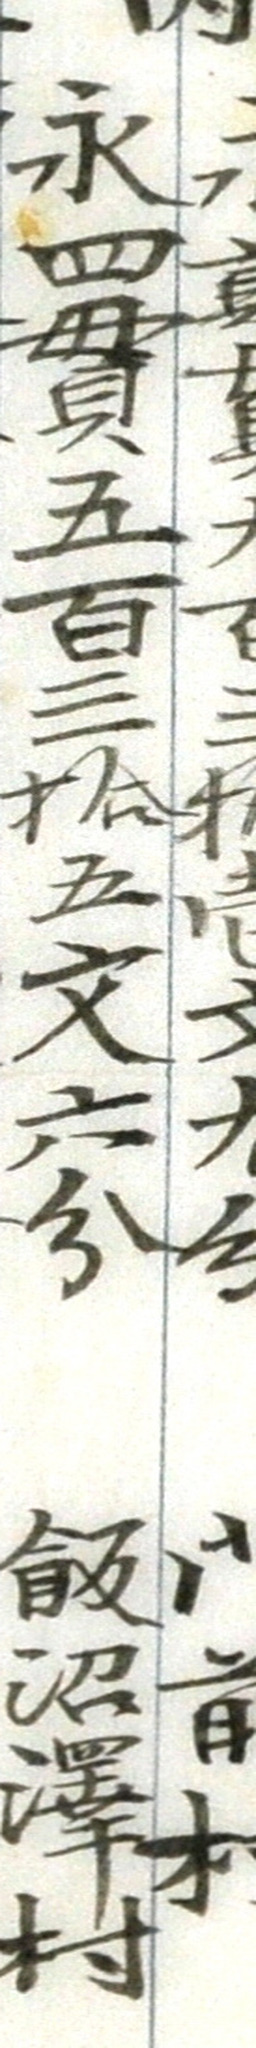永四貫五百三拾五文六分飯沼沢村
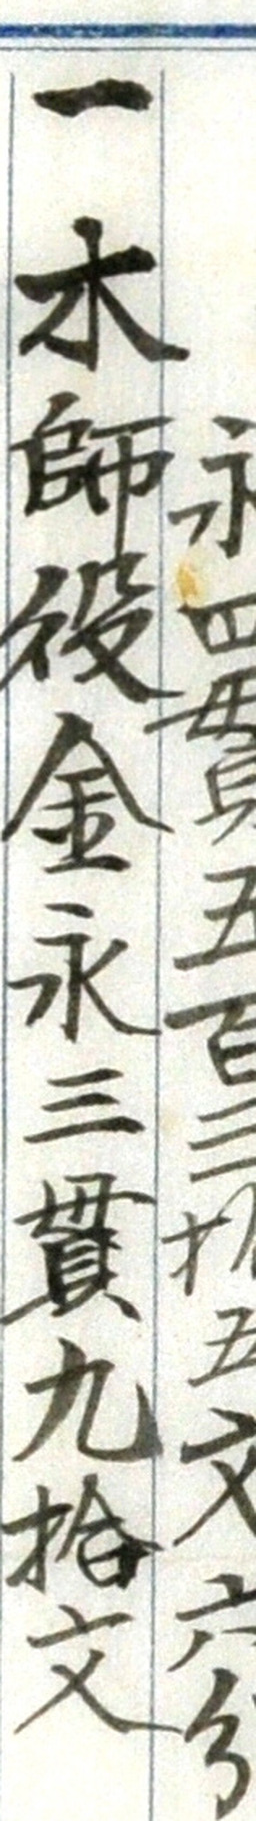一木師役金永三貫九拾文

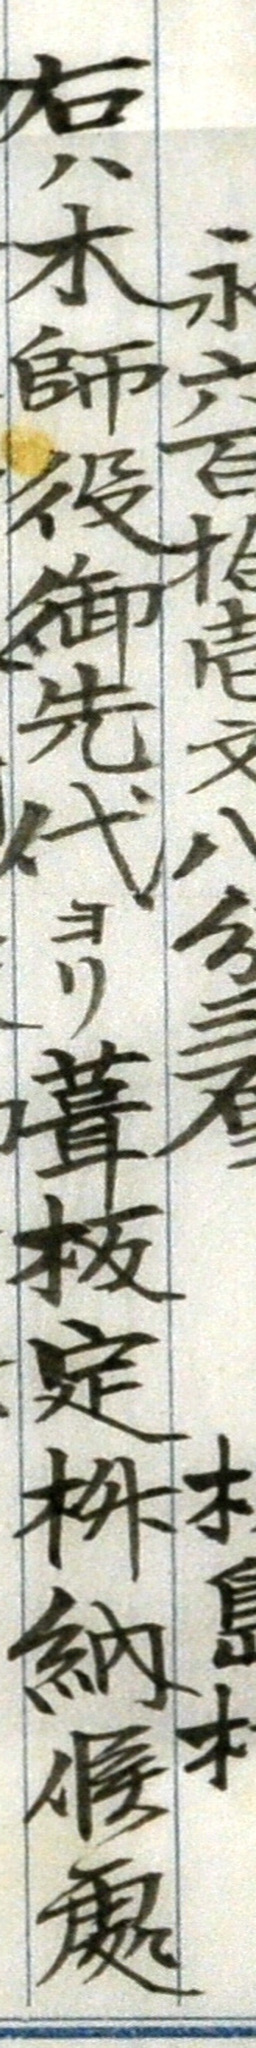右ハ木師役御先代ヨリ葺板定桝納候処
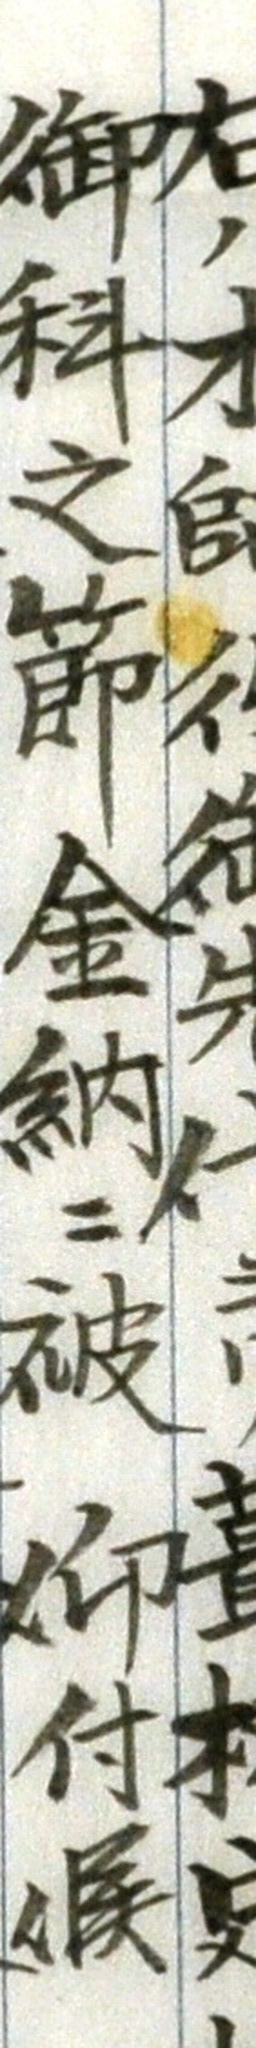御科之節金納ニ被仰付候
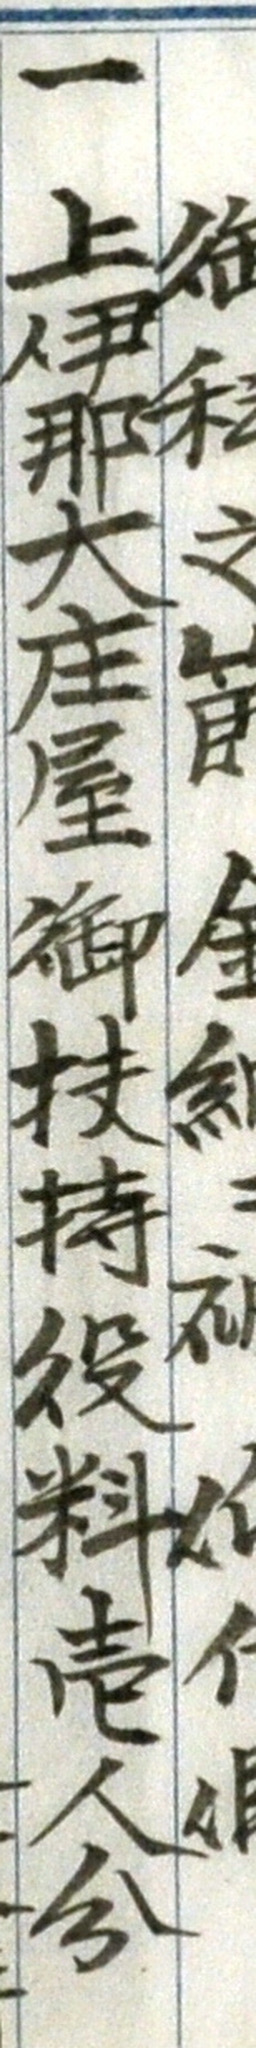一上伊那大庄屋御扶持役料壱人分
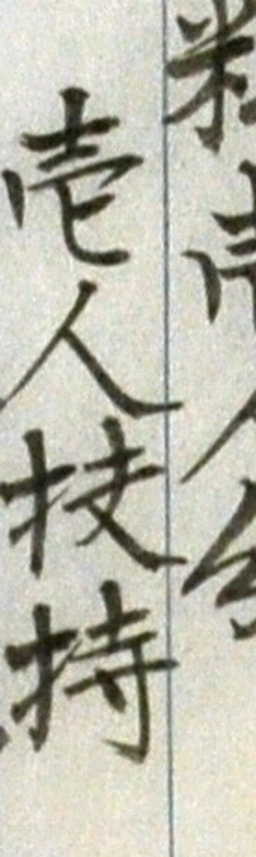壱人扶持
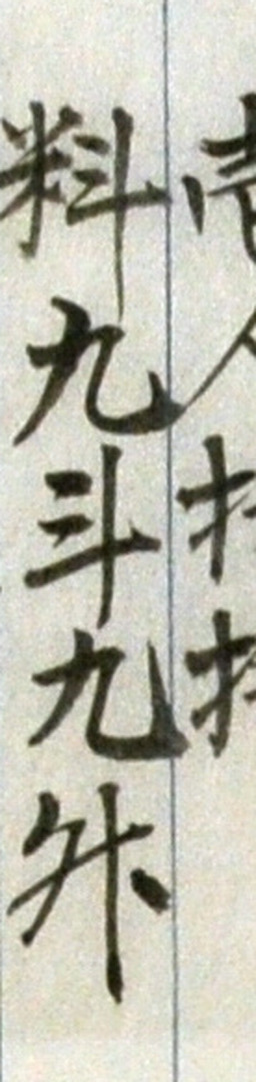料九斗九升
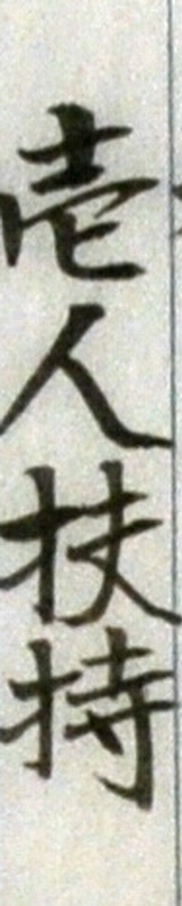壱人扶持
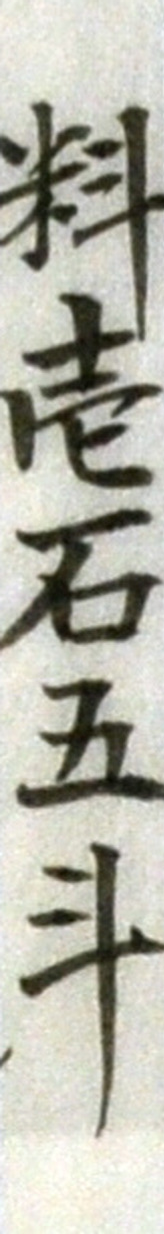料壱石五斗
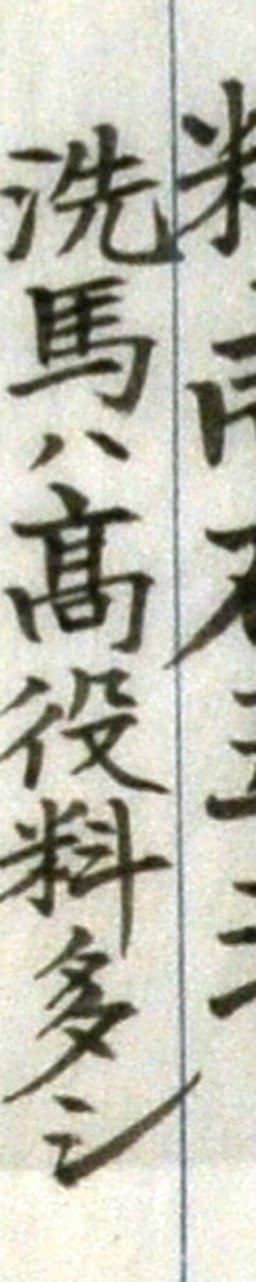洗馬ハ高役料多シ
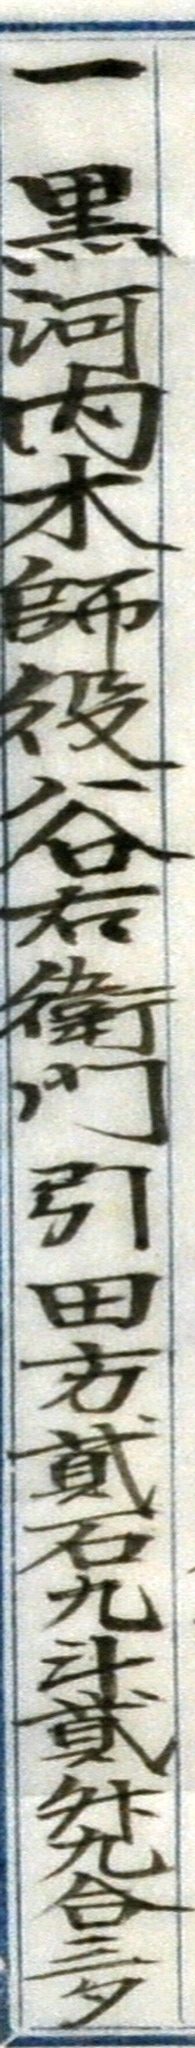一黒河内木師役谷右衛門引田方弐石九斗弐升九合三勺
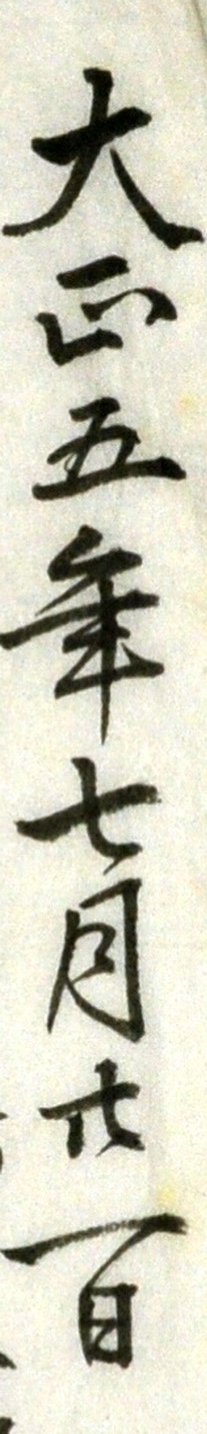大正五年七月廿一日
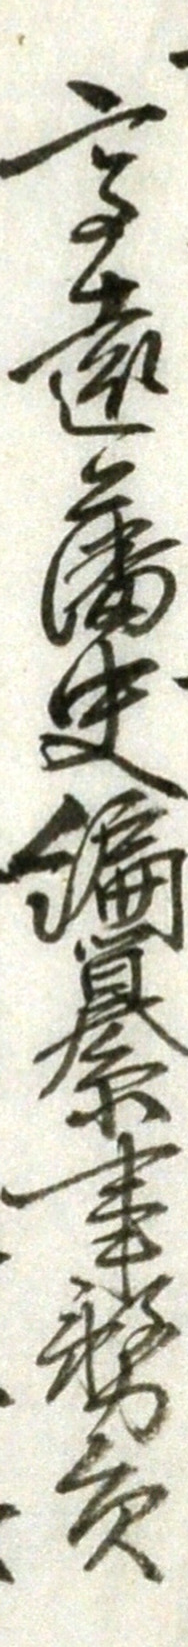高遠藩史編纂事務員
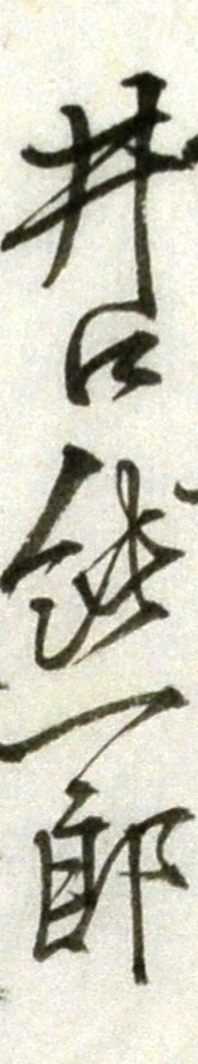井口純一郎
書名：御定法
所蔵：伊那市立高遠町図書館・合同会社AMANE
